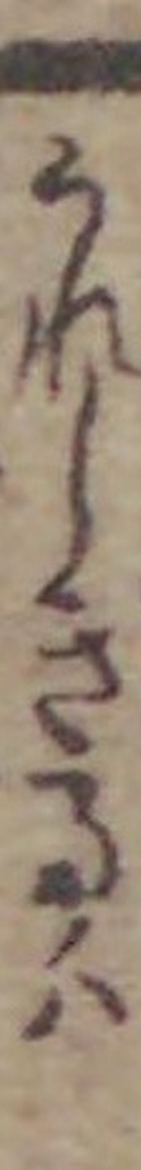うれしき事は
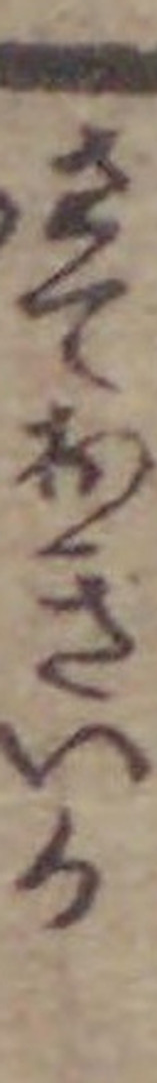さておきいか
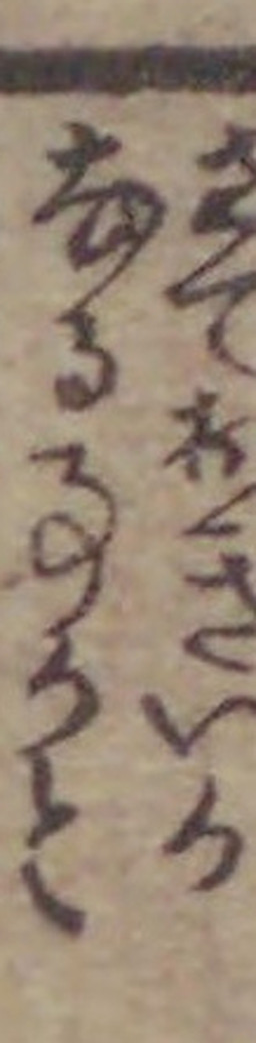なる事かと
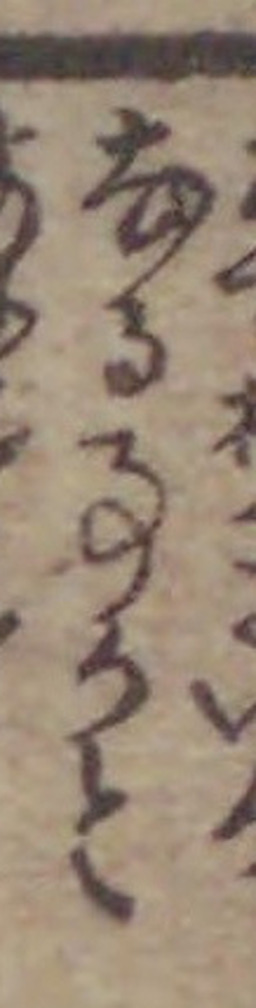なる事かと
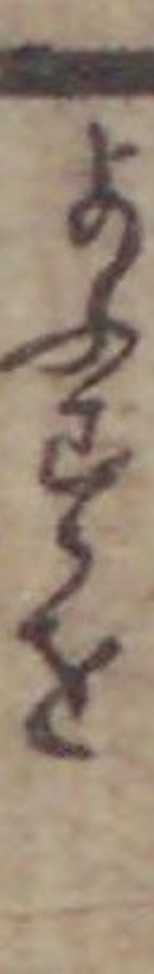よふすを
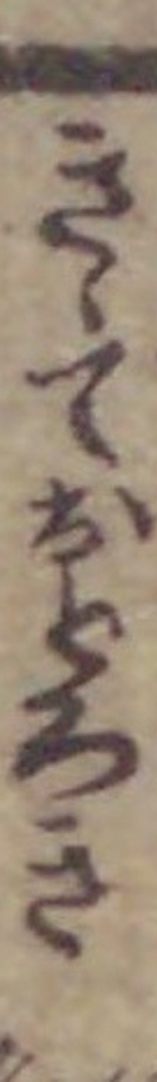きゝておとろき
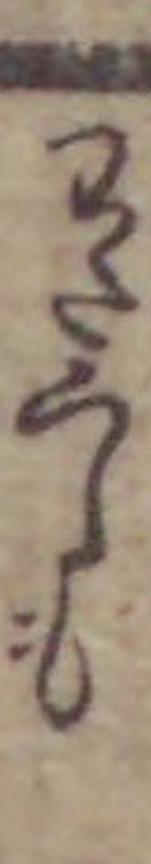わたくしも
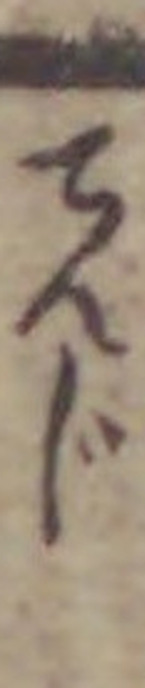てんじ
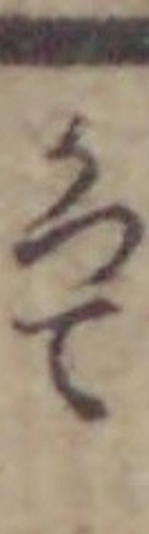かつて
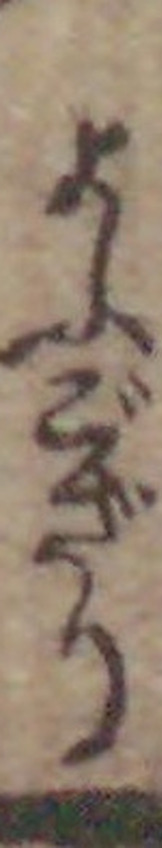よふござり
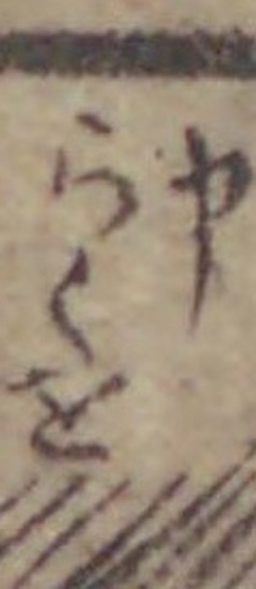らくを
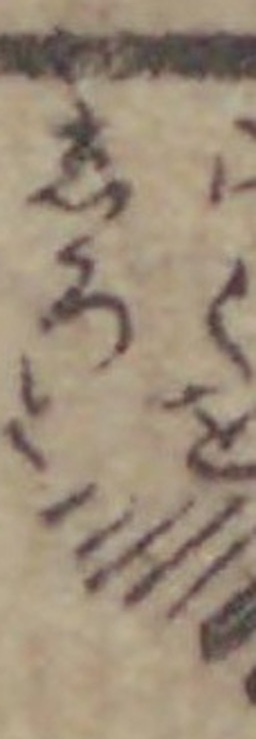しろと
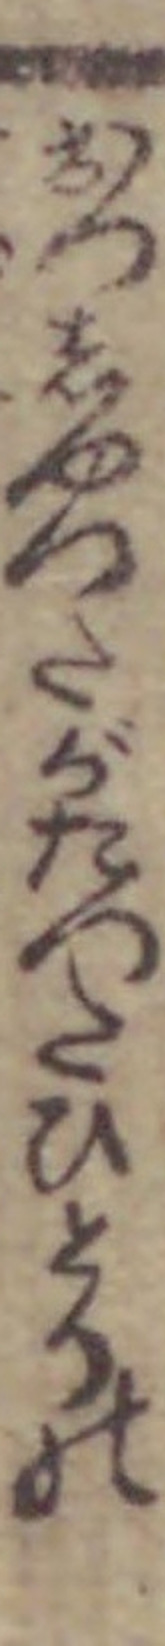おつしやるこがたつたひとりの
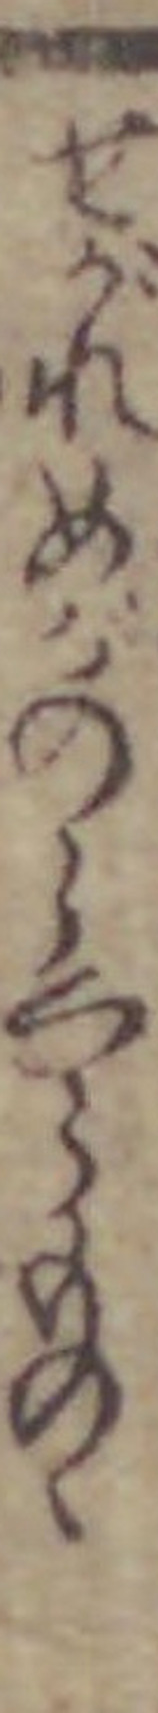せがれめがのらくらものゝ
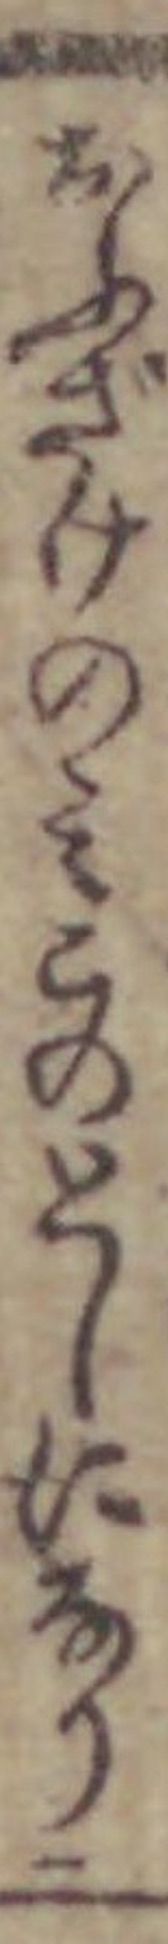おふざけのみこのとしになり
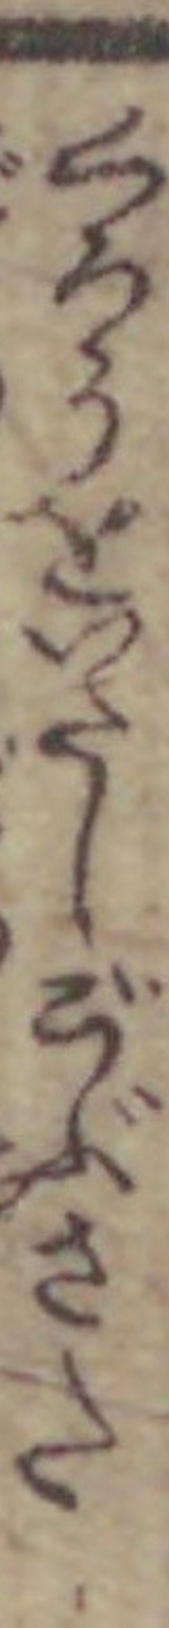くろうをいたしごぶさた
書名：御代の御寶
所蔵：国立国会図書館 National Diet Library, JAPAN
